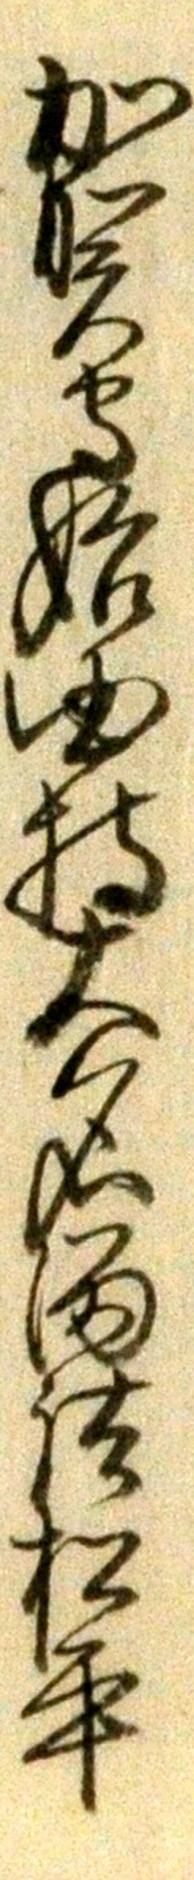加賀守始国持大名溜詰松平
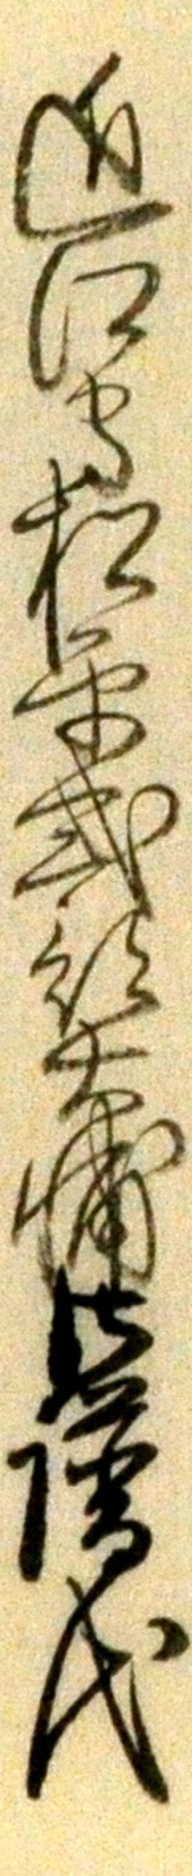近江守松平式部大輔御譜代
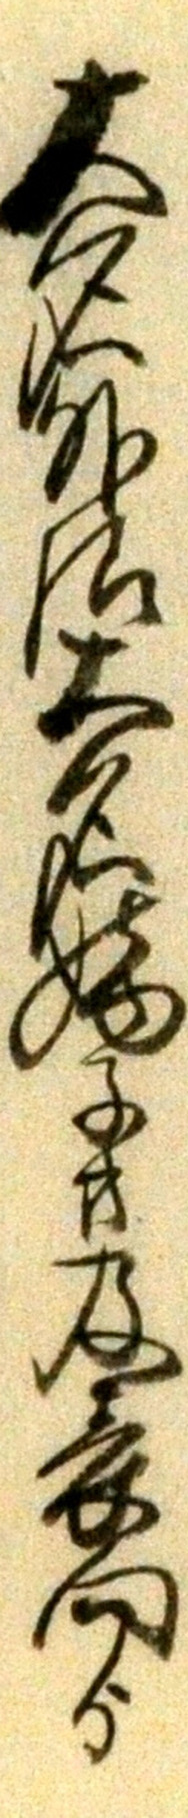大名外様大名嫡子共及表向ゟ
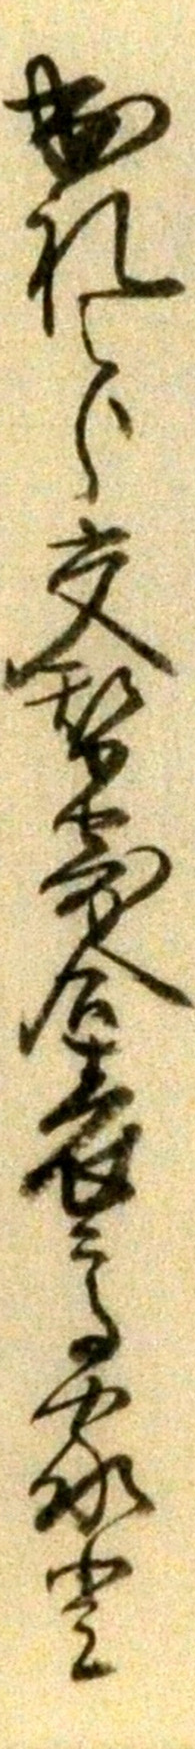出礼交替寄合表高家登
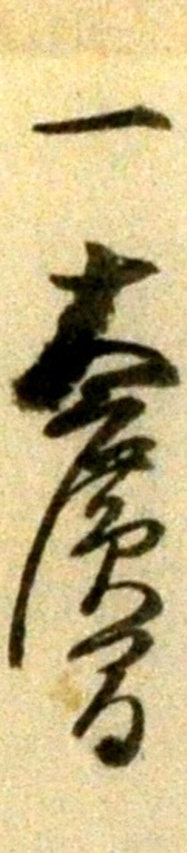一大広間
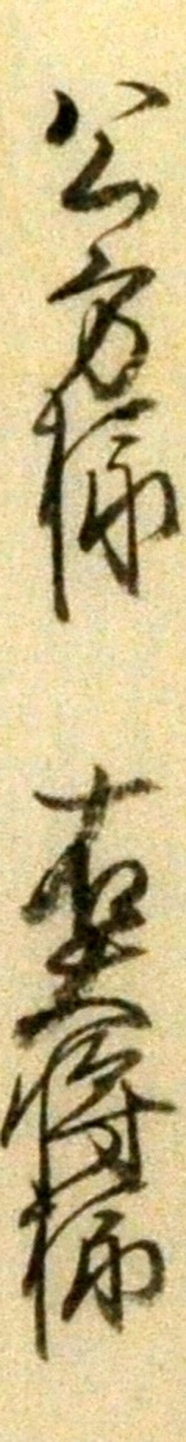公方様右大将様
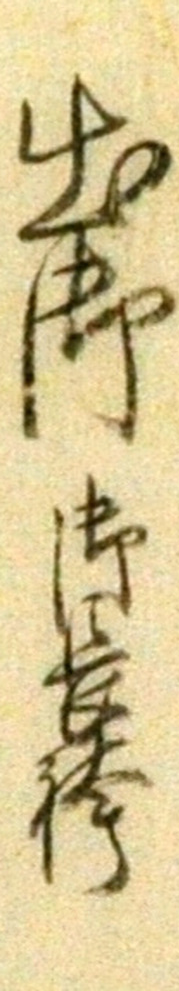出御御長袴
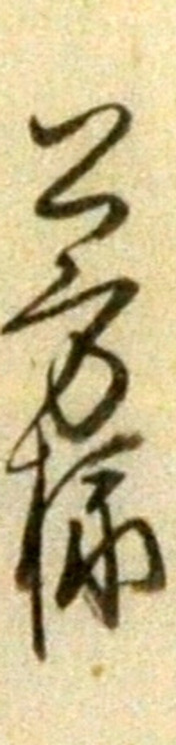公方様

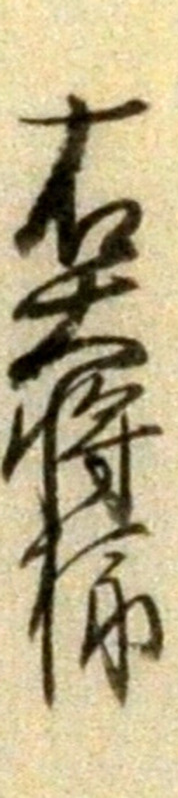右大将様
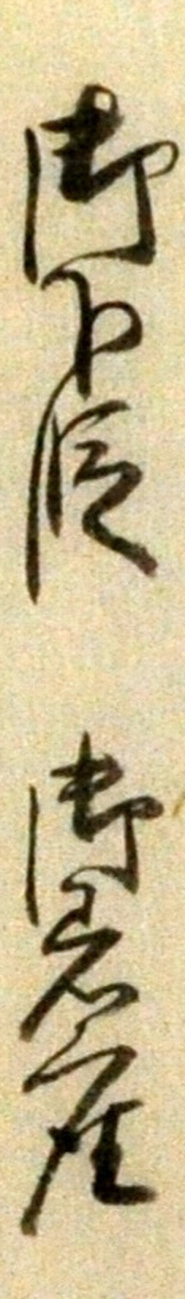御下段御着座
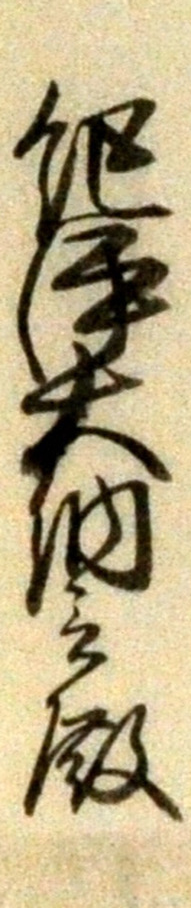紀伊大納言殿
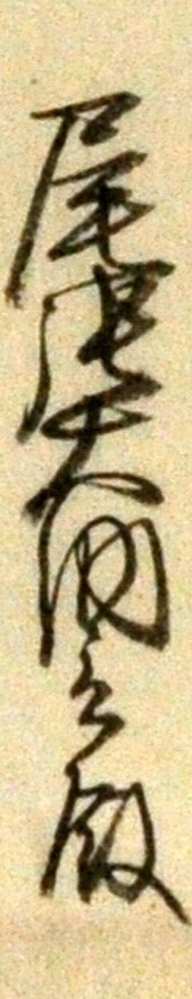尾張大納言殿
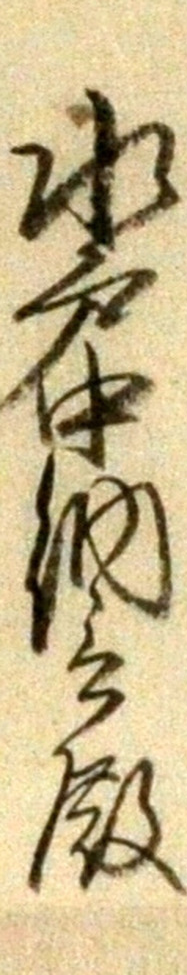水戸中納言殿
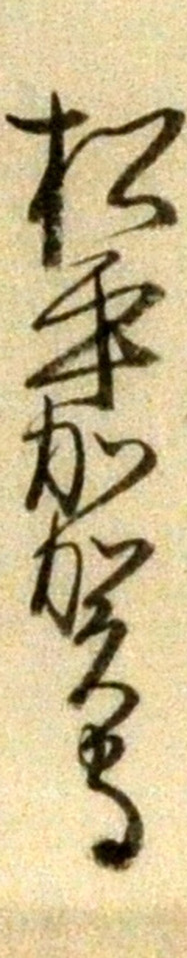松平加賀守
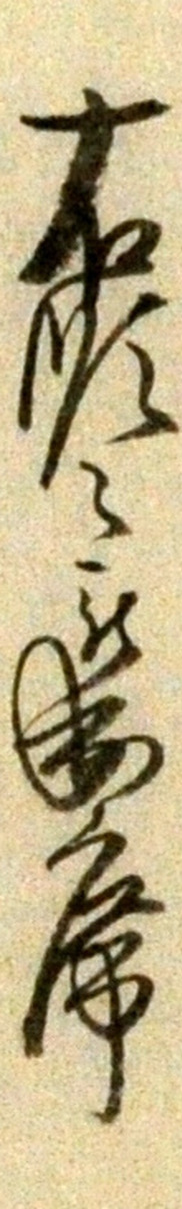右順ニ被出席
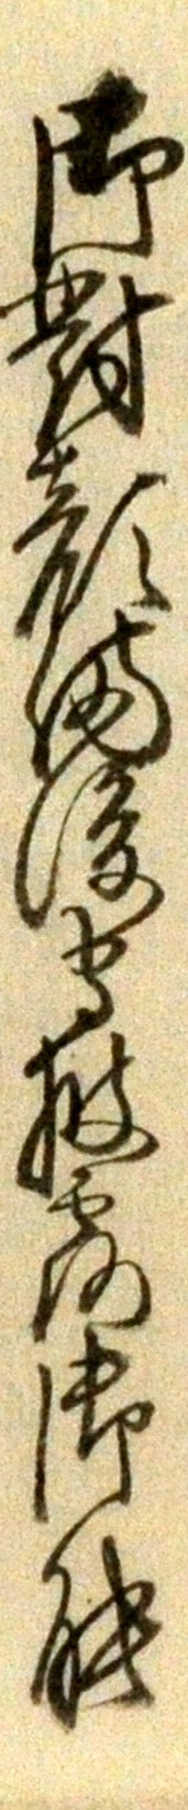御対顔備後守披露御能
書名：御馳走御能ノ節ノ留外
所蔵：伊那市立高遠町図書館・合同会社AMANE
